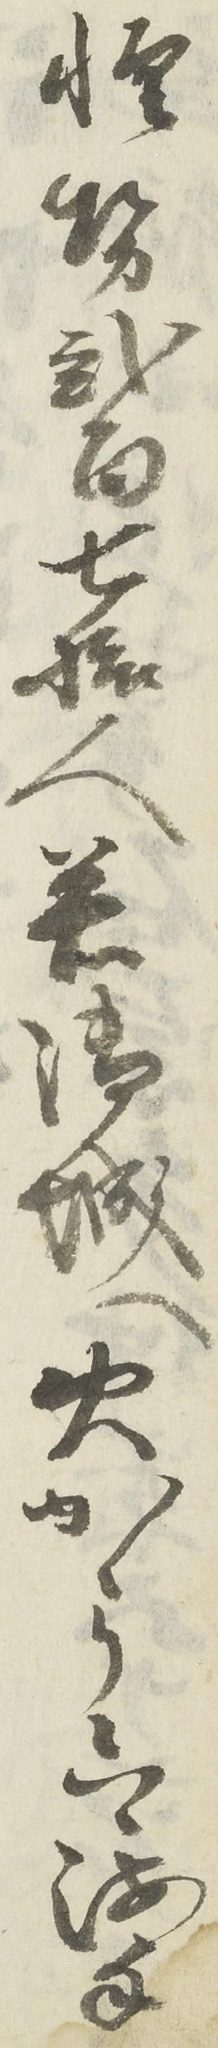軽勢弐百七拾人着御城へ火かゝり候はゝ海手
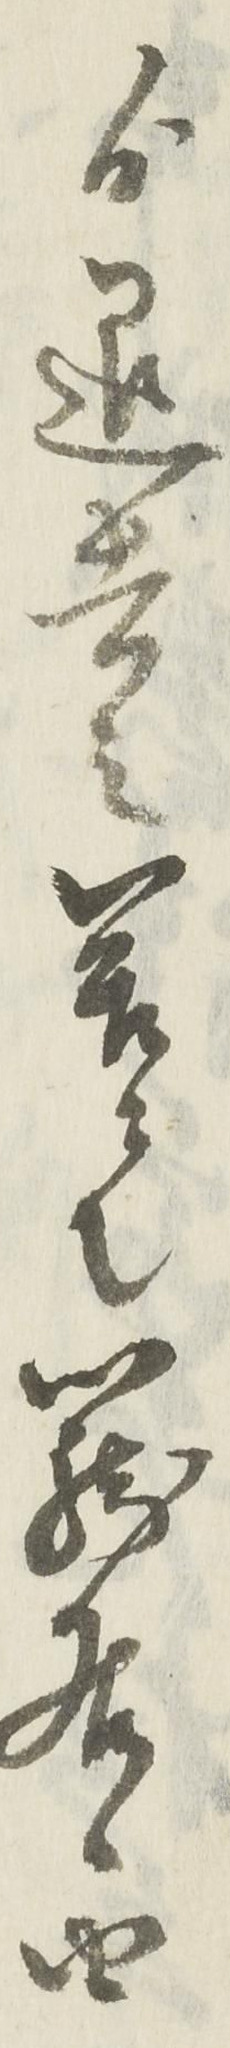ゟ退去之筈ニて籠居候由
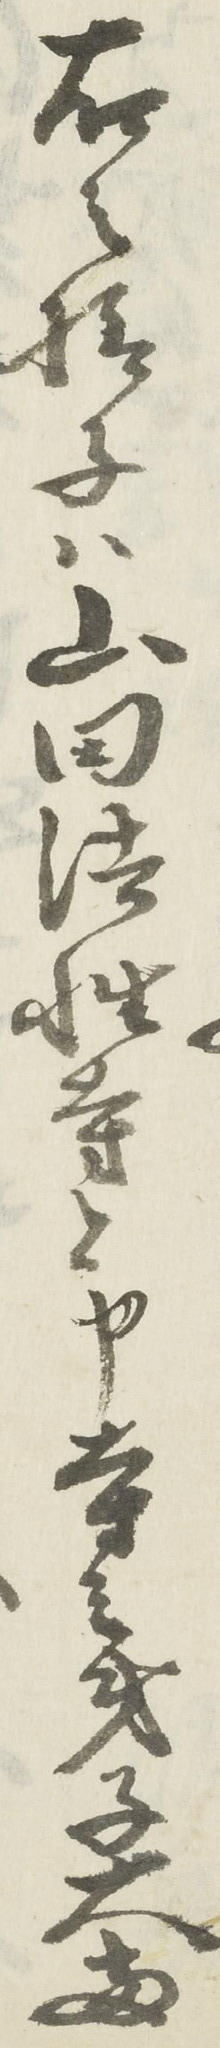右の様子は山田法性寺と申寺之弟子大両
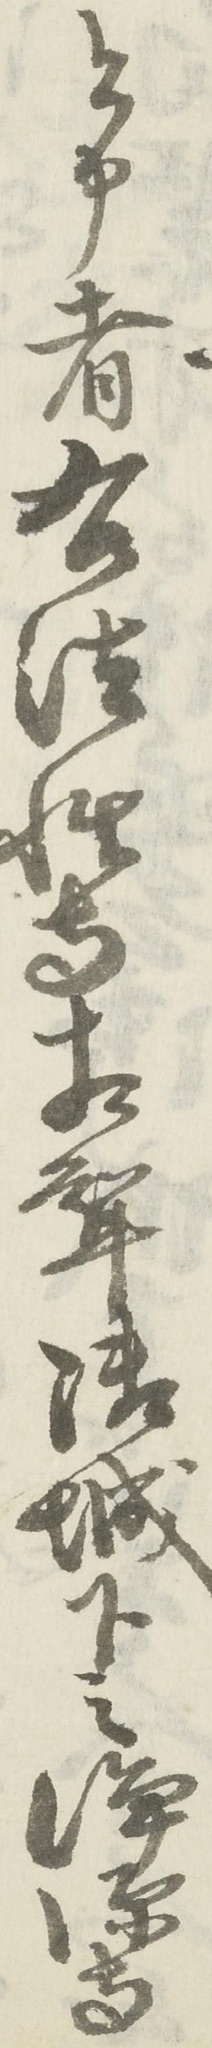と申者右法性寺相婿御城下之浄源寺
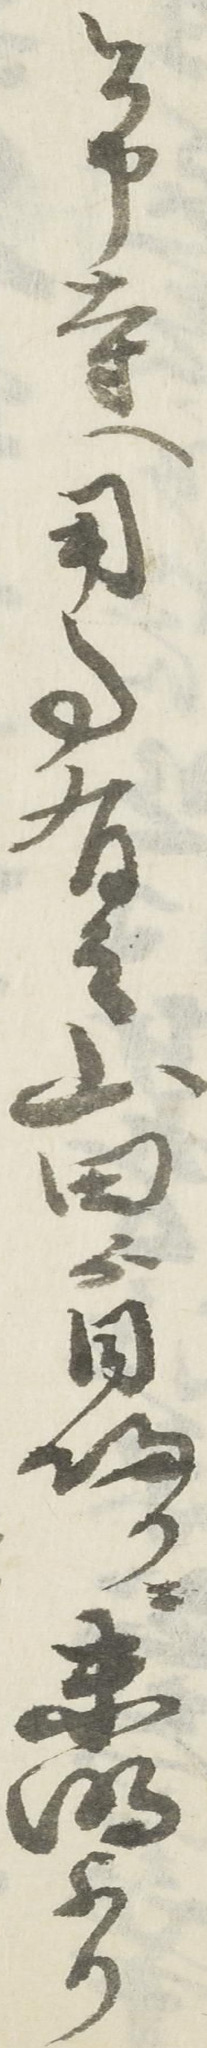と申寺へ用事有之山田ゟ日帰りニ未明より
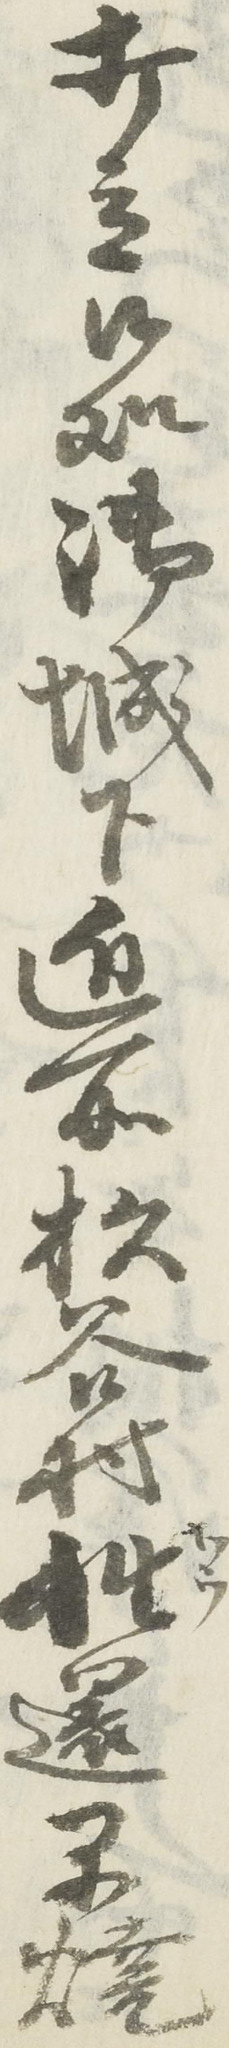打立候処御城下近所杉谷村往還早焼
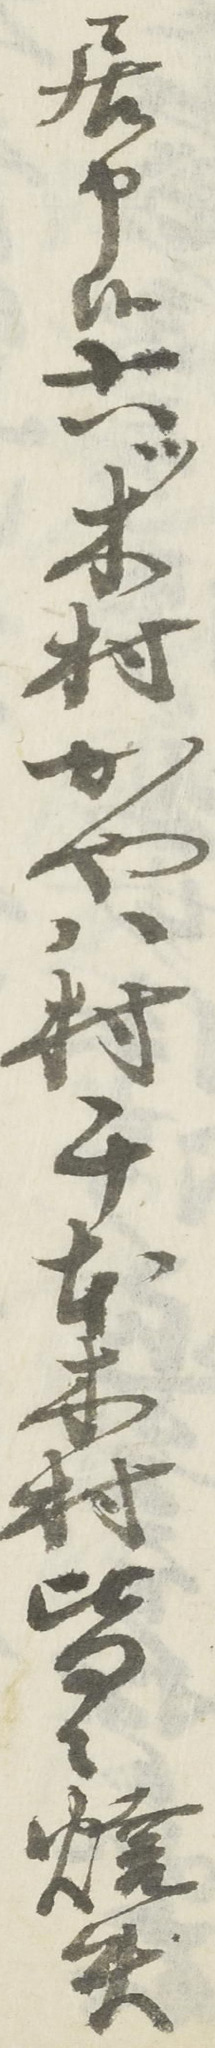居申候六ツ木村かやは村千本木村皆々焼失
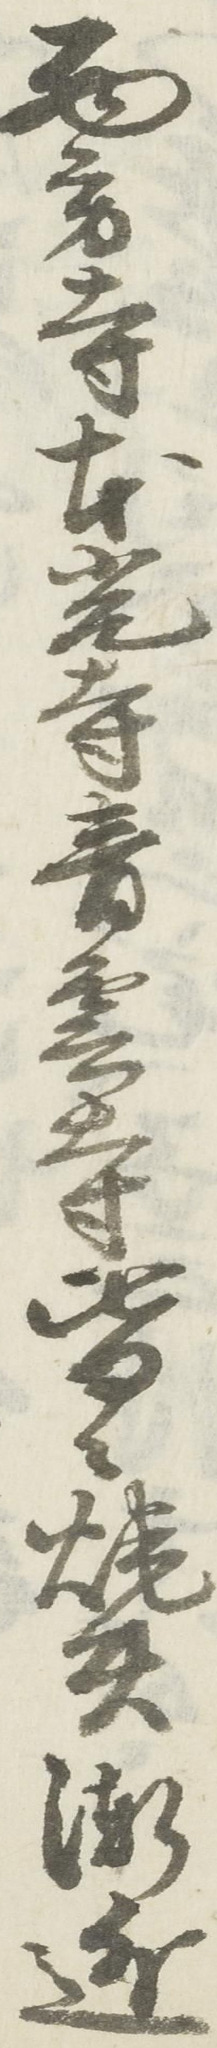西方寺本光寺青雲寺皆々焼失漸逃
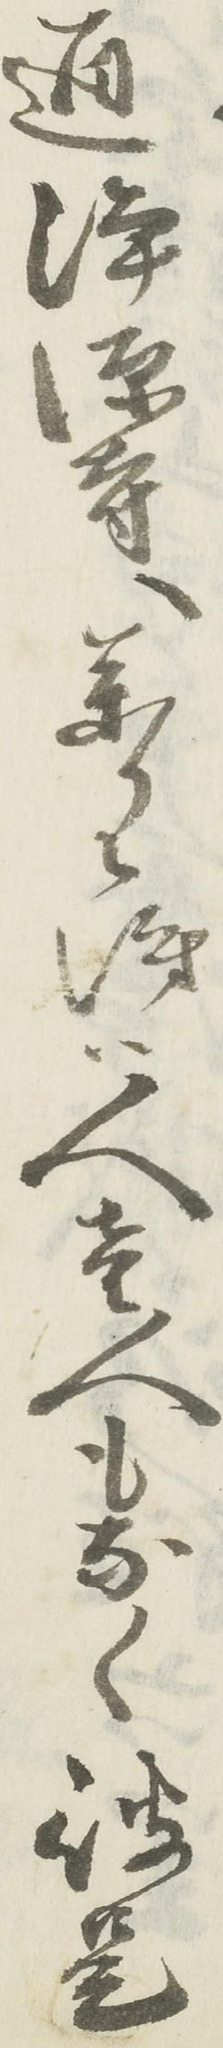通浄源寺へ参り候得は人壱人もなく彼是
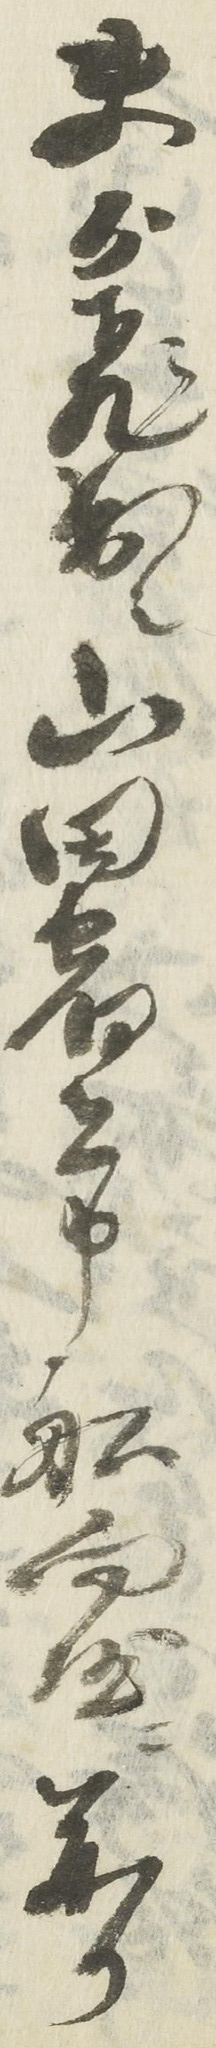夫ゟ飛出し山田宿と申舩向屋ニ参り
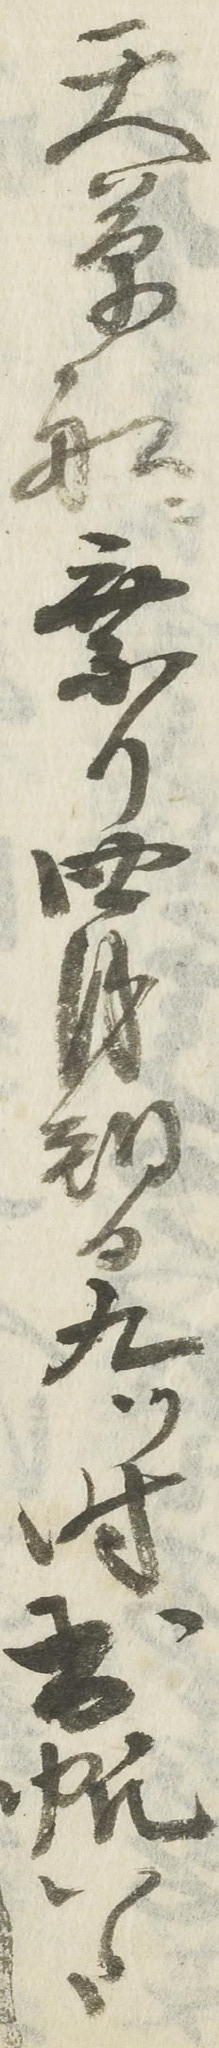天草舩ニ乗り四月朔日九ツ時出帆いたし
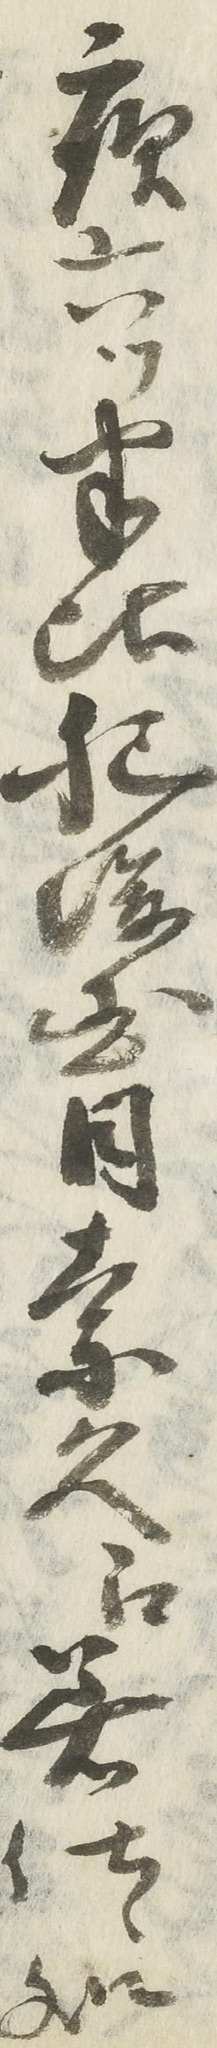夜六ツ半頃肥後国日奈久江着仕候処
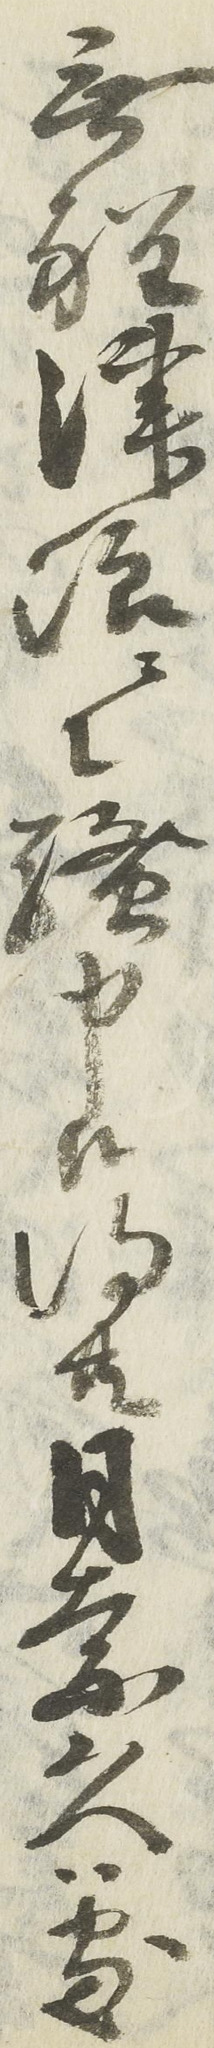無程津浪ニて騒申候得共日奈久は家
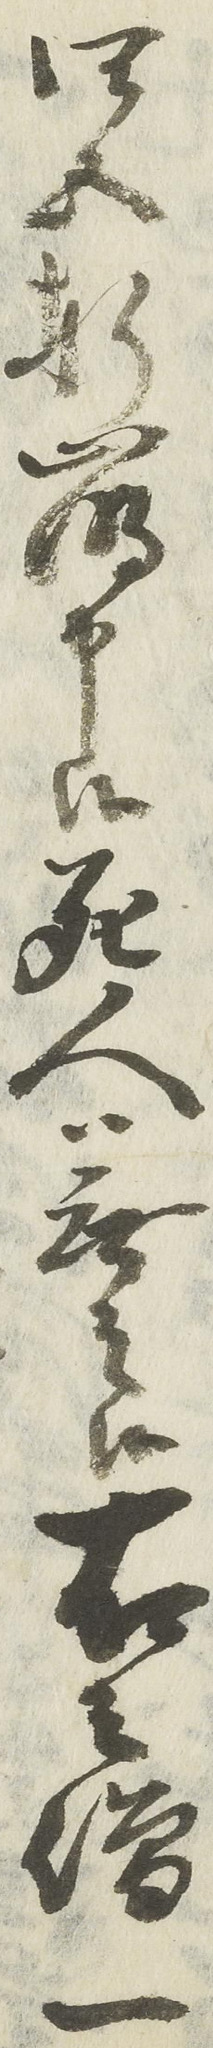四五軒崩申候死人は無之候右の僧一
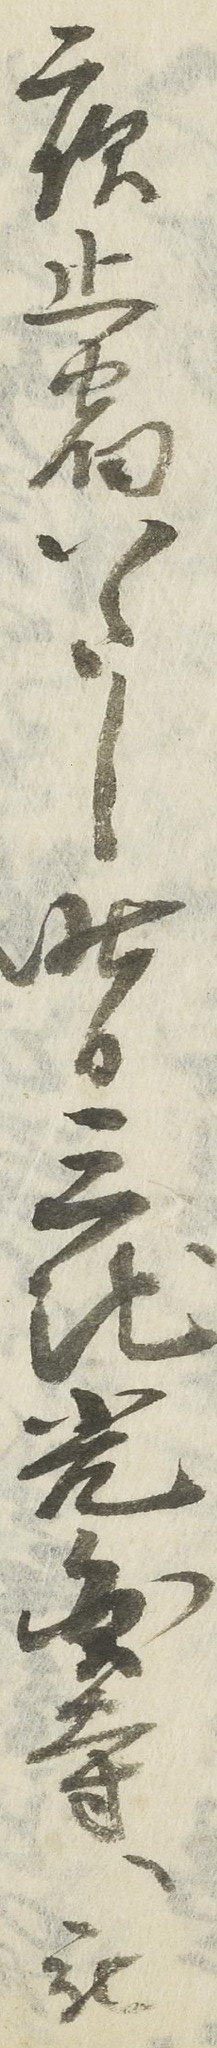夜止宿いたし昨日三池光円寺へ被
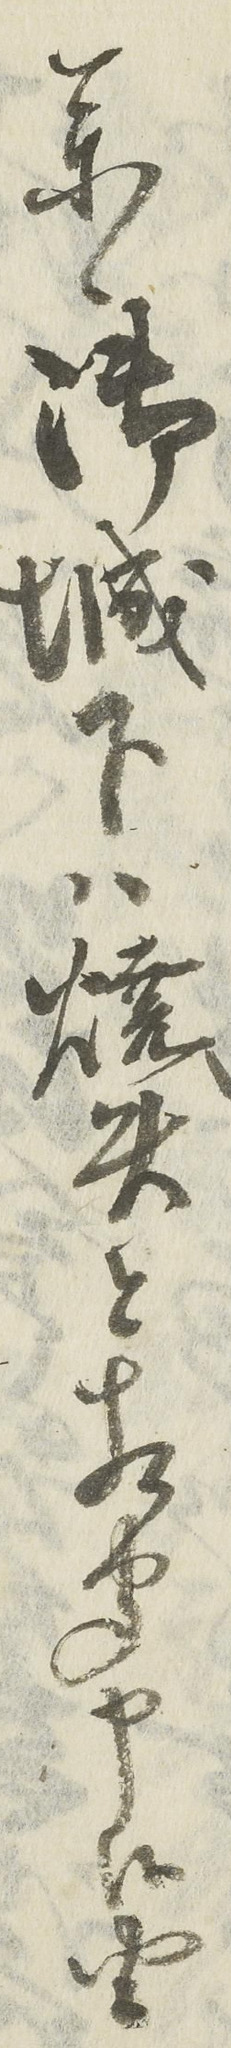参候御城内下は焼失と相聞申候由
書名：後見笑
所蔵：東京大学地震研究所図書室 Earthquake Research Institute Library, The University of Tokyo, JAPAN
